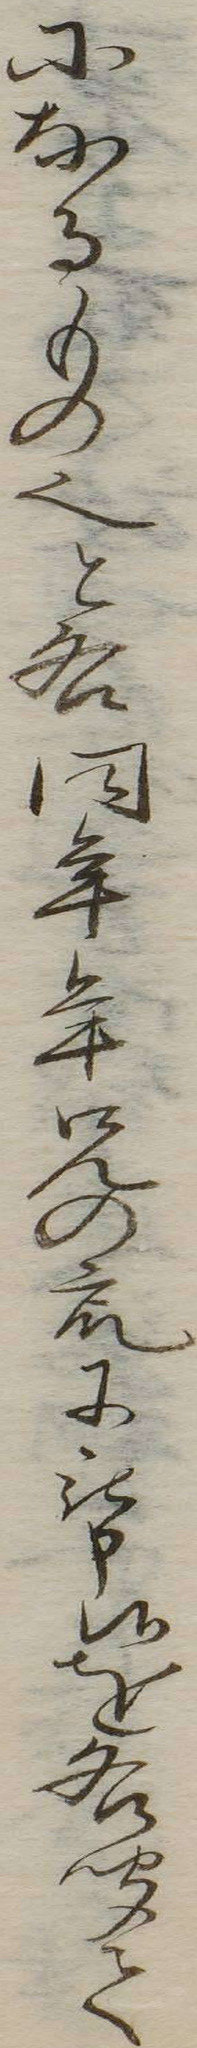になるもの也と各同年年兄の衆に被申候を各聞て
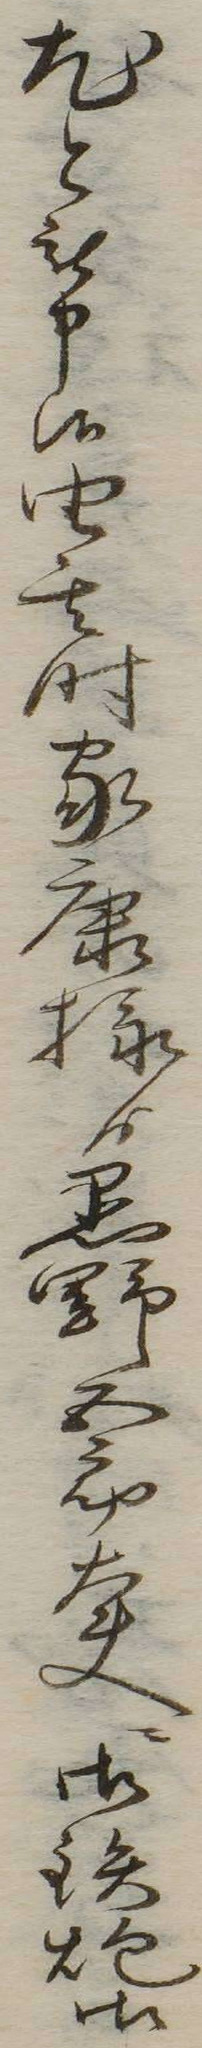尤と被申候由其時家康様ゟ黒野五郎大夫ニ御鉄炮御
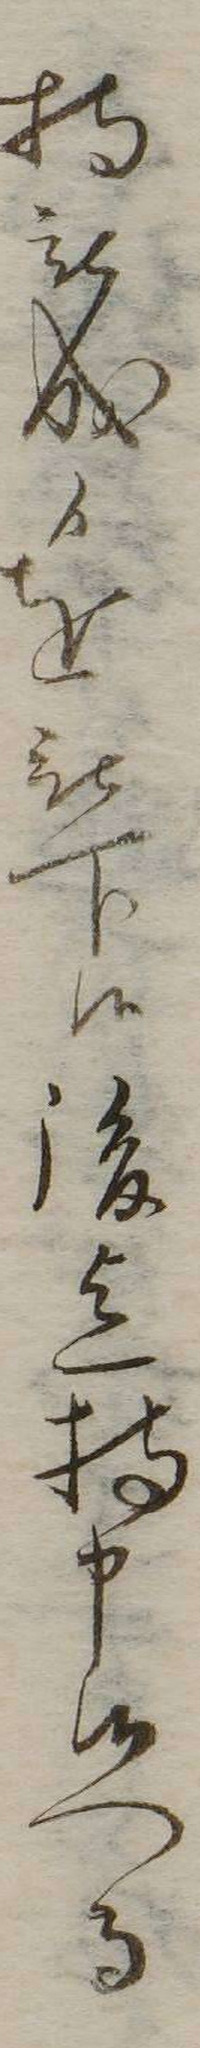持被成候を被下候後迄持申候つる
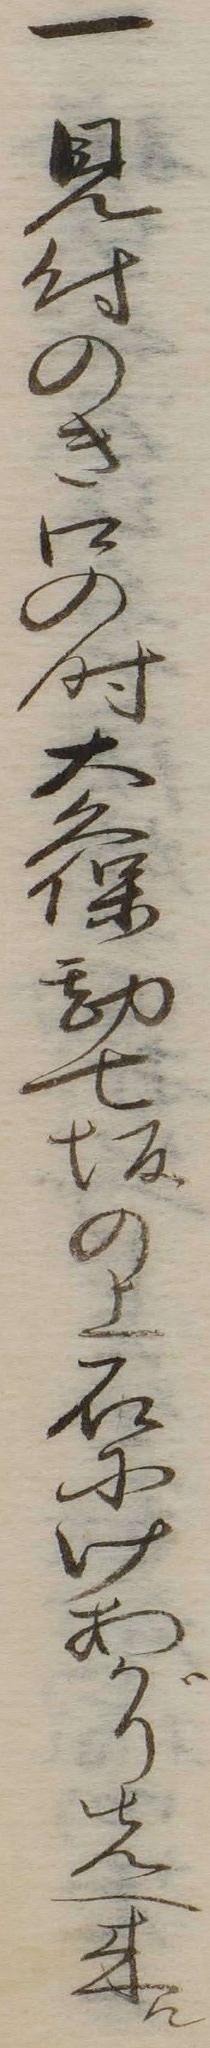一見付のき口の時大久保勘七坂の上石にけあがり先へ来ル

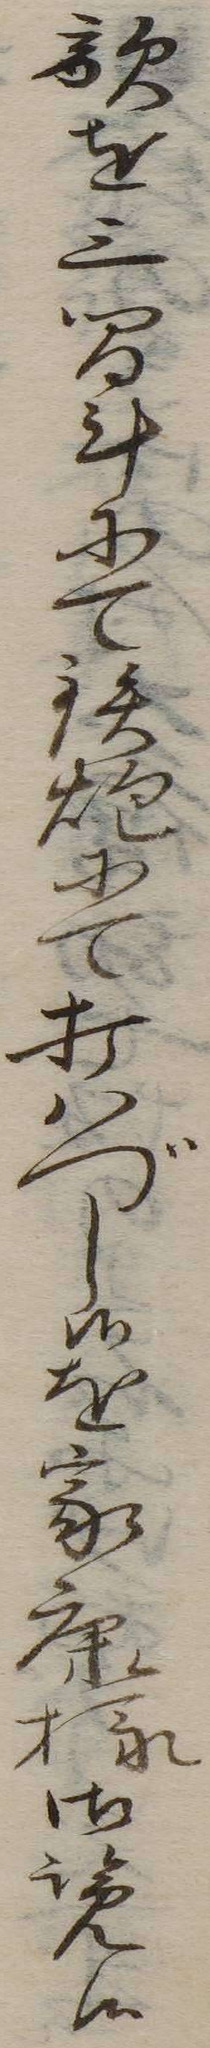敵を三間計にて鉄炮にて打ハづし候を家康様御覧候
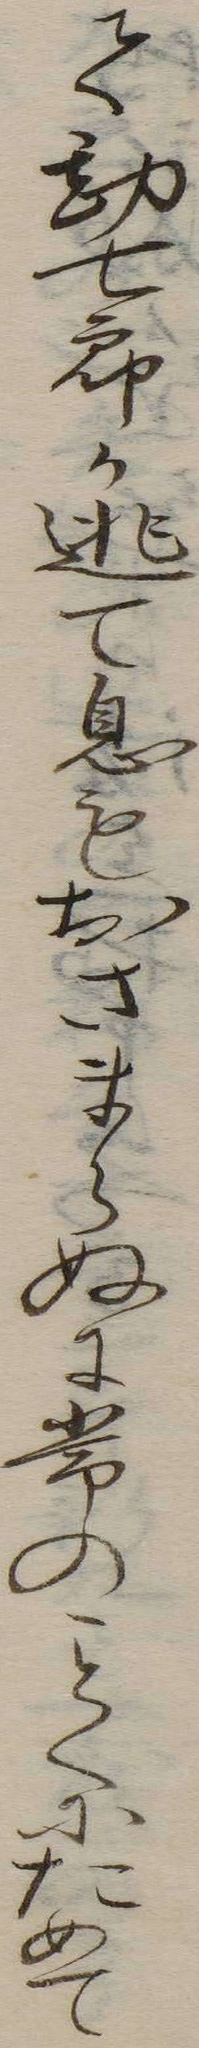て勘七郎か逃て息もおさまらぬに常のことくにためて
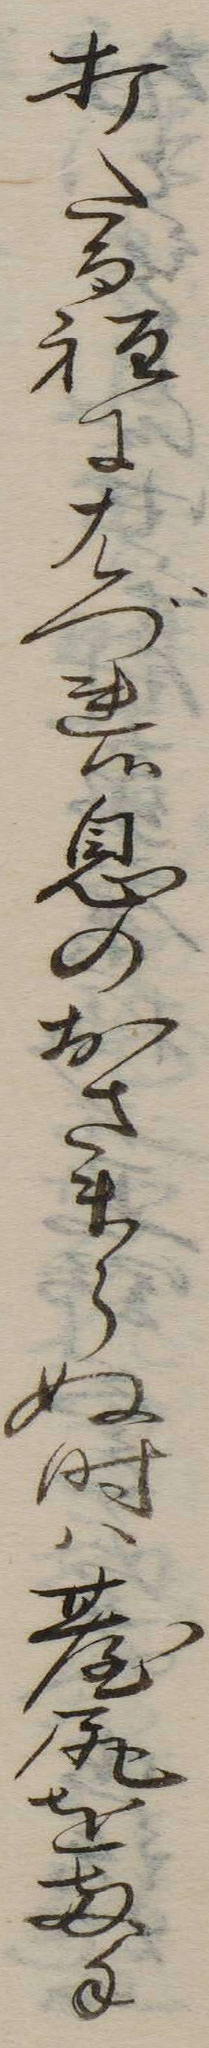打たる程にはづれ候息のおさまらぬ時ハ台尻を両手
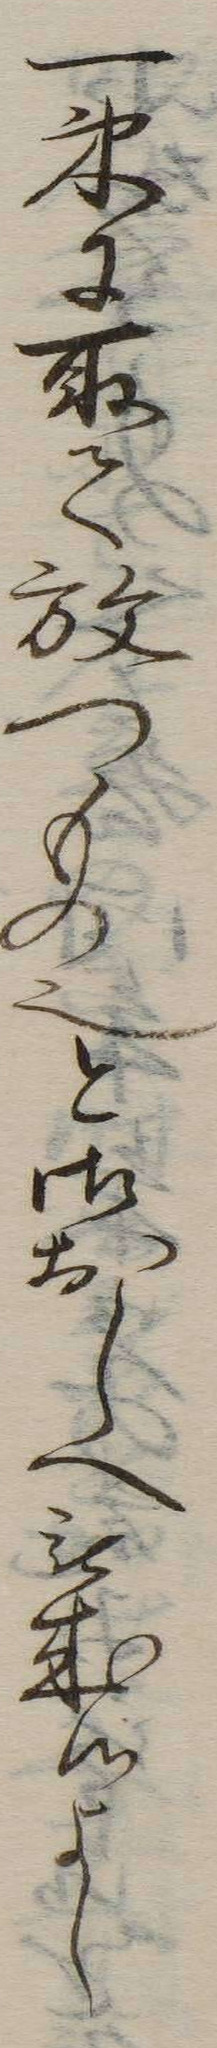一束に取て放つもの也と御おしへ被成候よし
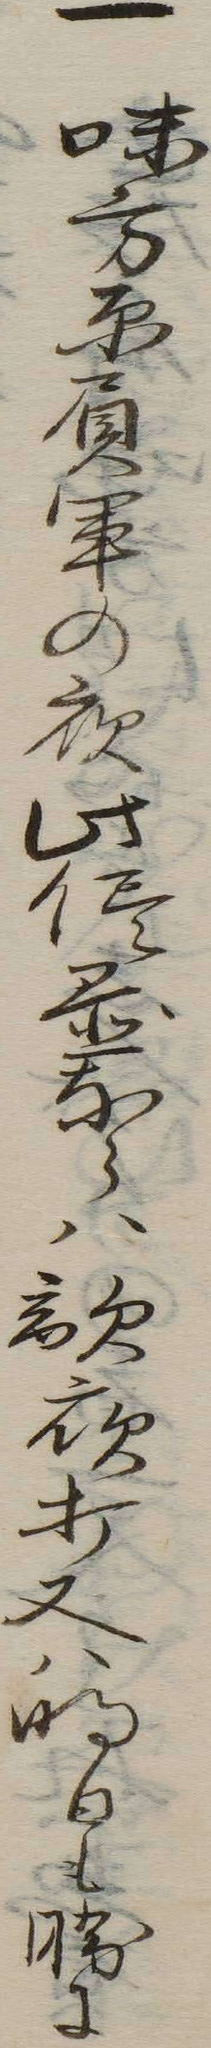一味方原負軍の夜此侭置ならハ敵夜打又ハ明日も勝に
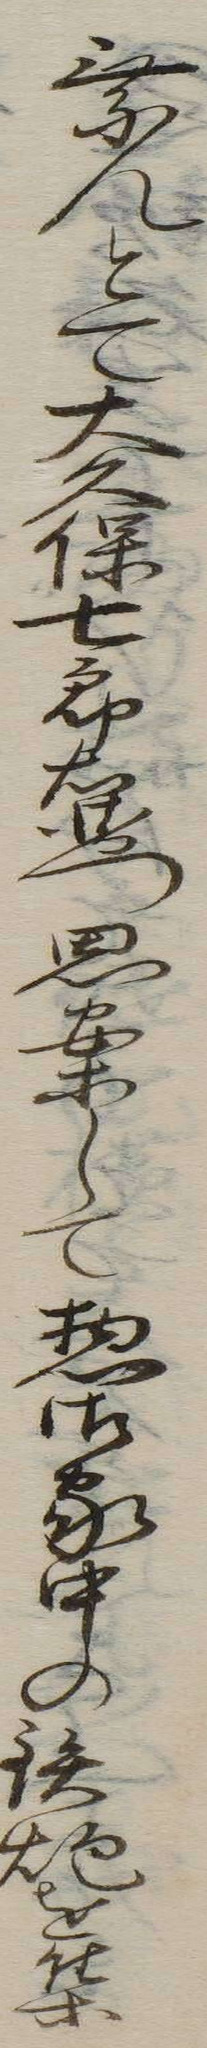乗んとて大久保七郎右衛門思案して惣御家中の鉄炮を集
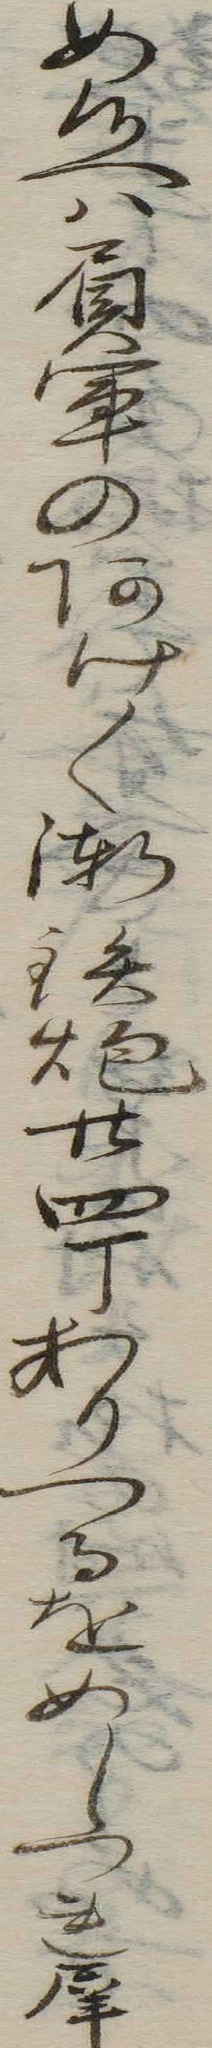め候へハ負軍のあけ〳〵漸鉄炮廿四丁ありつるをめしつれ庠
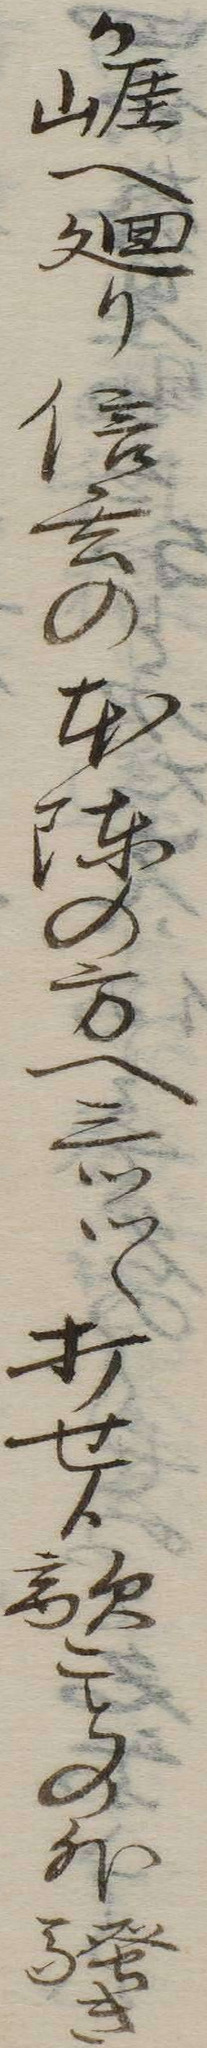か崖へ廻り信玄の本陣の方へ三ツツ丶打せ候敵ことの外騒き
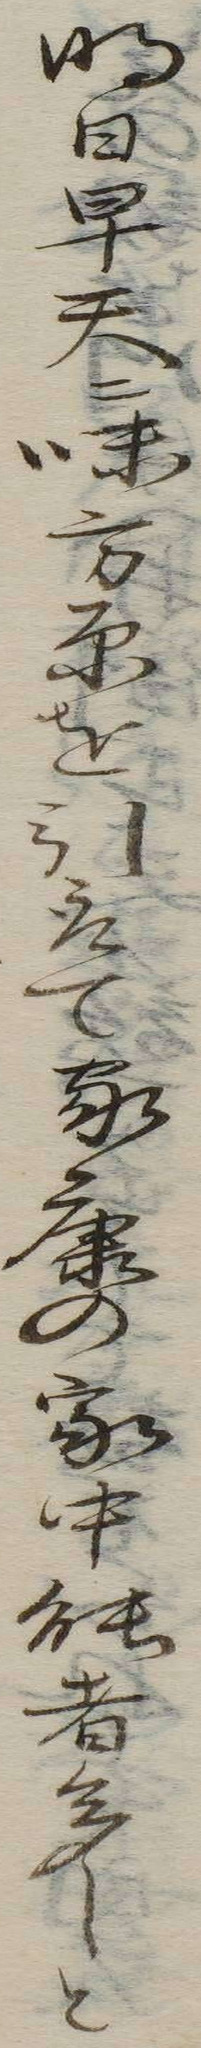明日早天ニ味方原を引取て家康の家中能者多しと
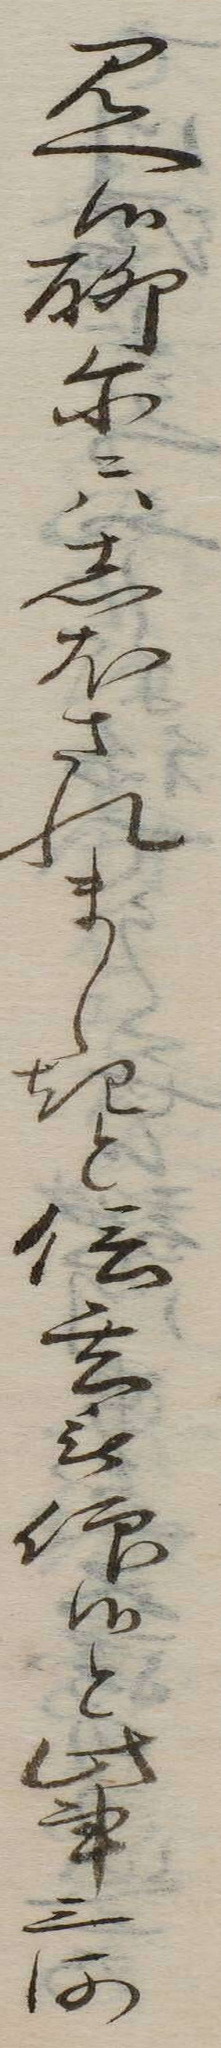見へ候聊尓ニハしほされましきと信玄被仰候と此事三河
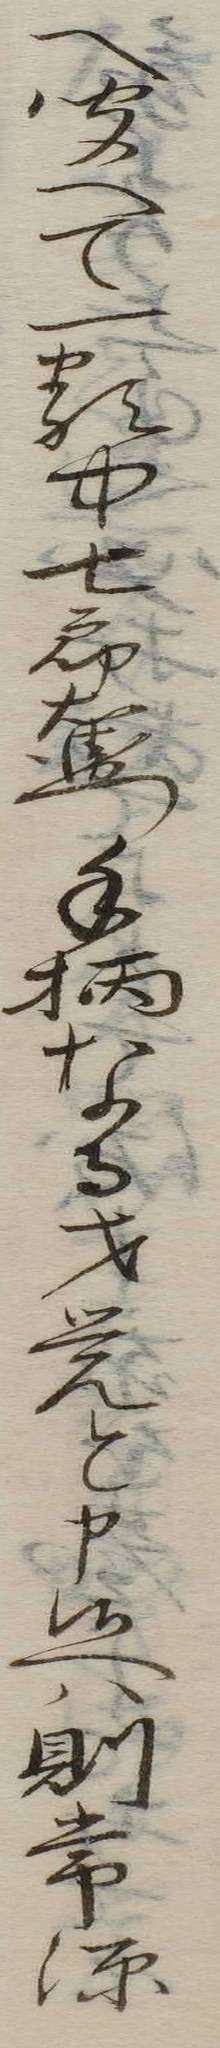へ聞へて一類中七郎右衛門手柄なる才覚と申候へハ則常源
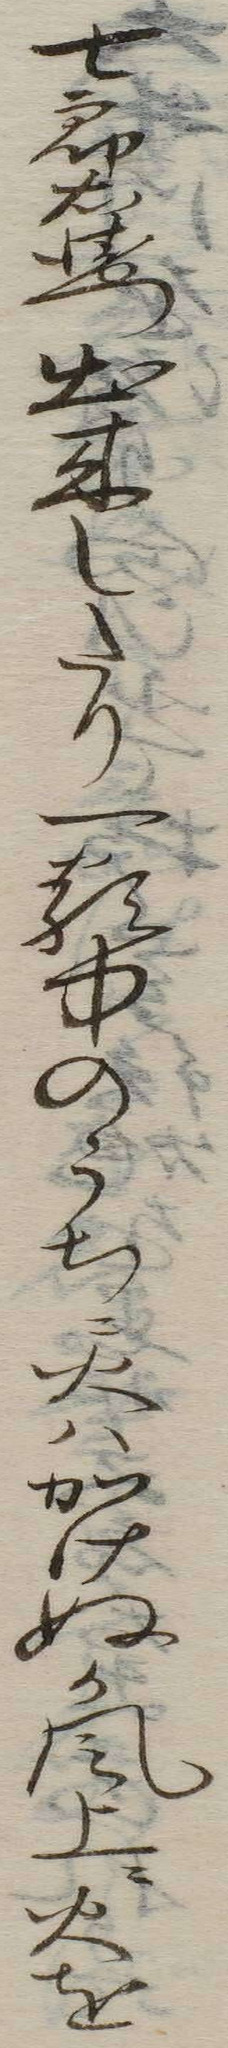七郎右衛門出来したり一類中のうちニ火ハかけぬか風上ニ火を
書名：三河之物語
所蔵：国文学研究資料館
